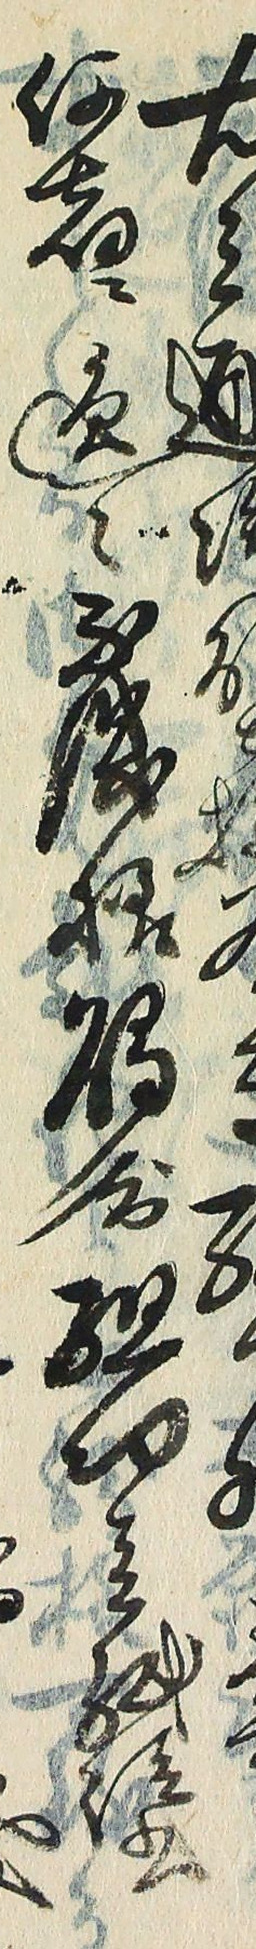何者に逸々不洩様触知組切壱紙請書
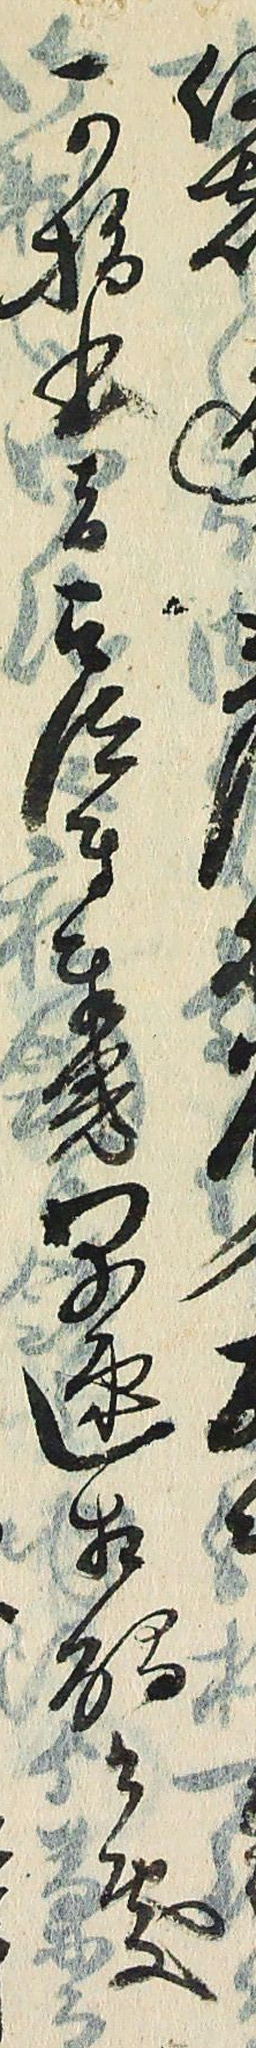可指出旨被仰付奉畏早速相触候処
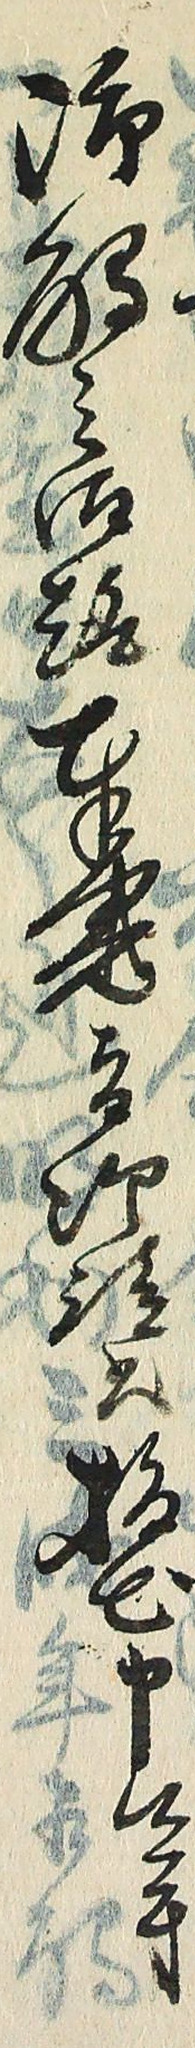御触之御趣奉畏旨御請書指出申候に付
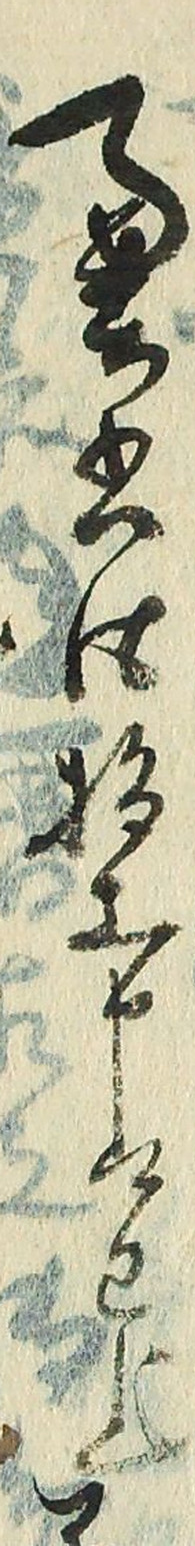奥書仕指上申候已上
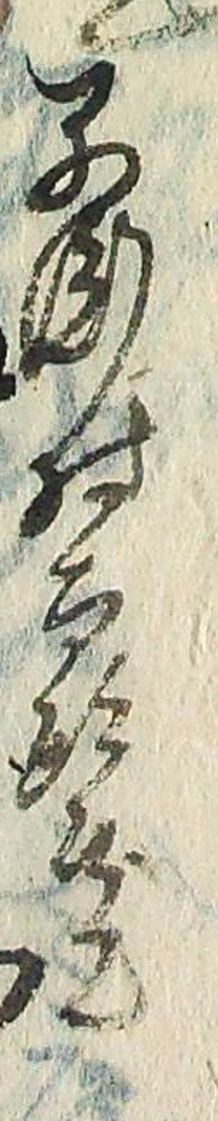早淵村与頭庄屋
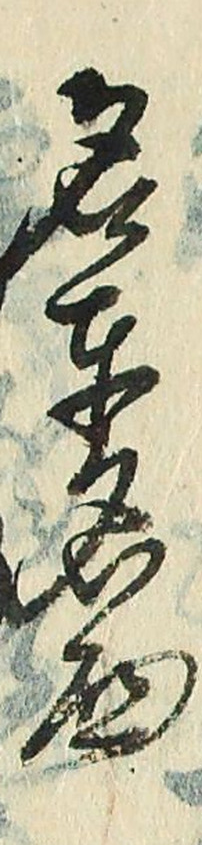名東名西
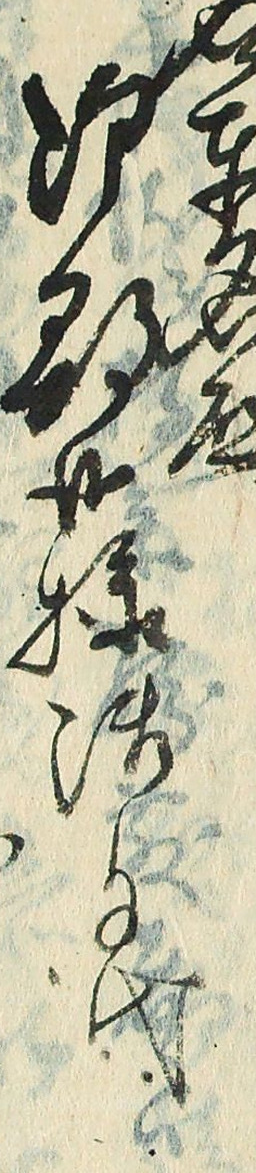御郡代様御手代
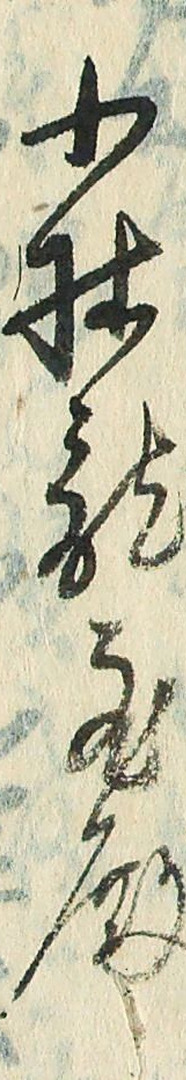小林龍三殿

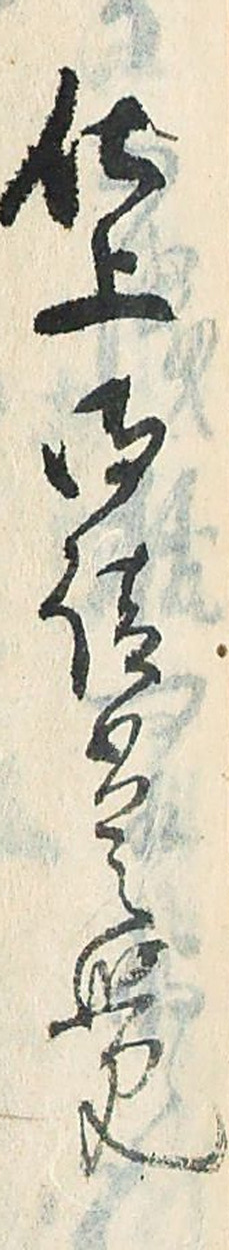仕上御請書之覚
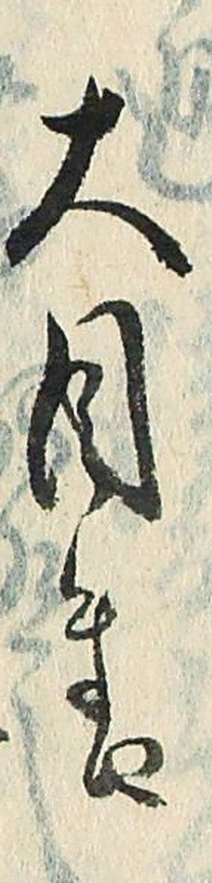大目付江
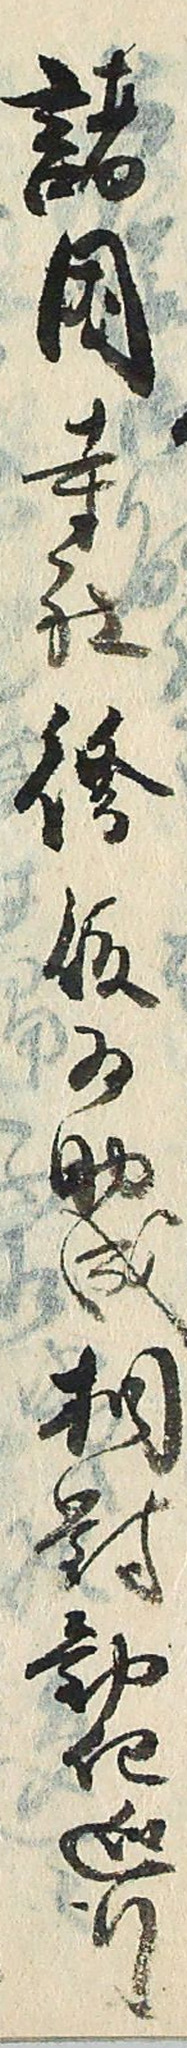諸国寺社修復為助成相対勧化巡行
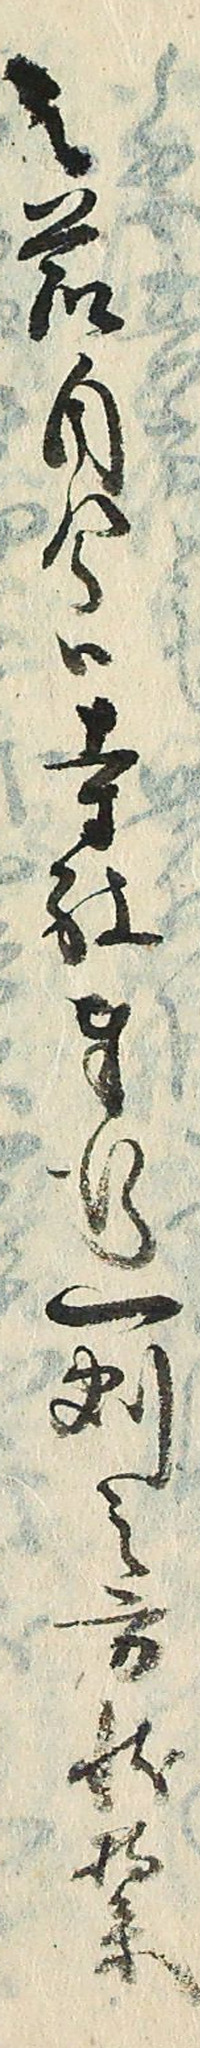之節自今は寺社奉行一判之方状持参
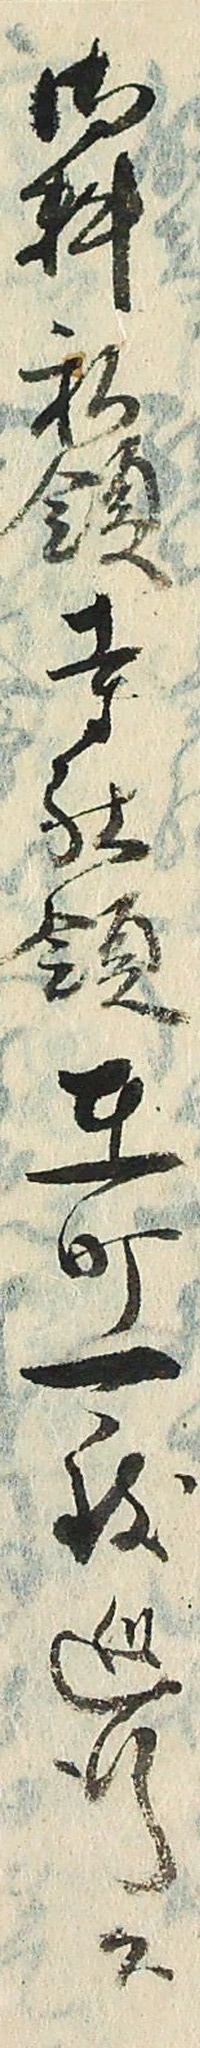御料私領寺社領在町一致巡行候
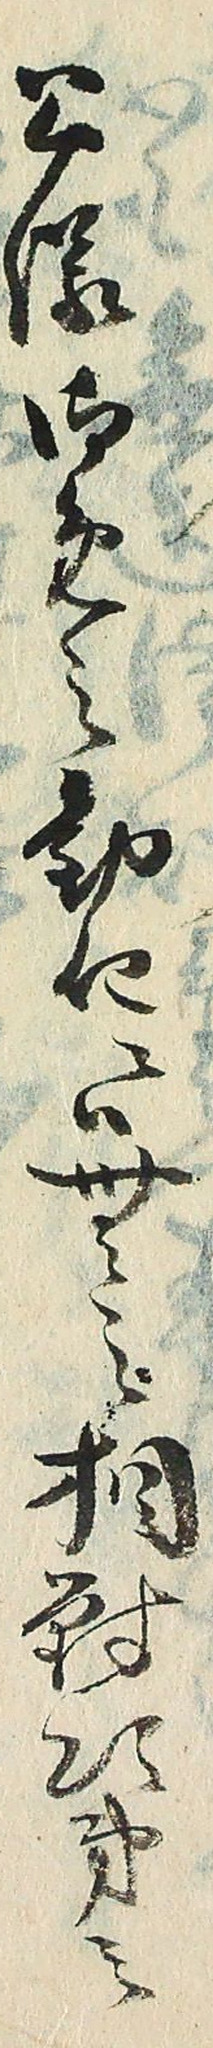公儀御免之勧化には無之相對次第之
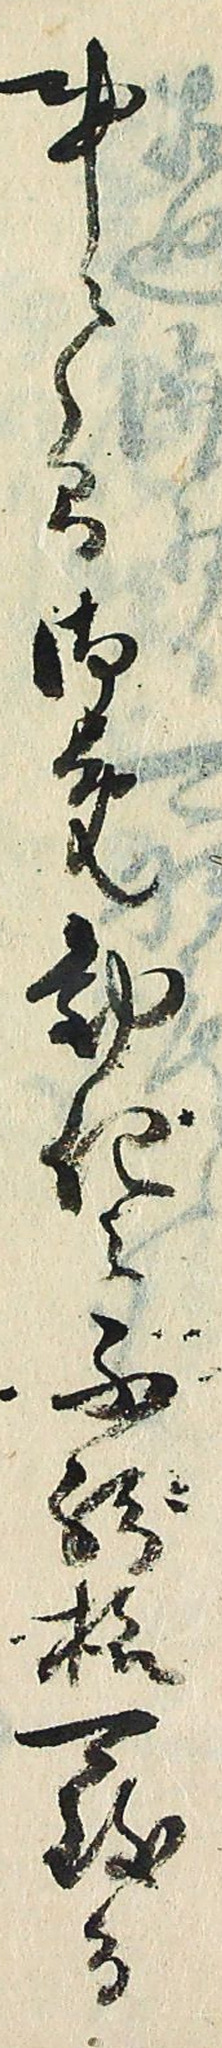事に候間御免勧化に不紛様可致旨
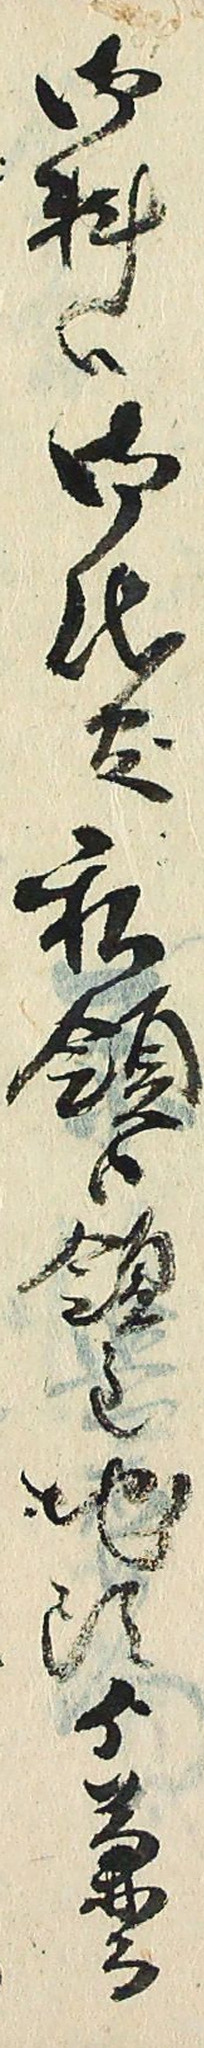御料は御代官私領は領主地頭ゟ兼而
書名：諸御用御□受書控
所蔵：鳴門教育大学 Naruto University of Education
